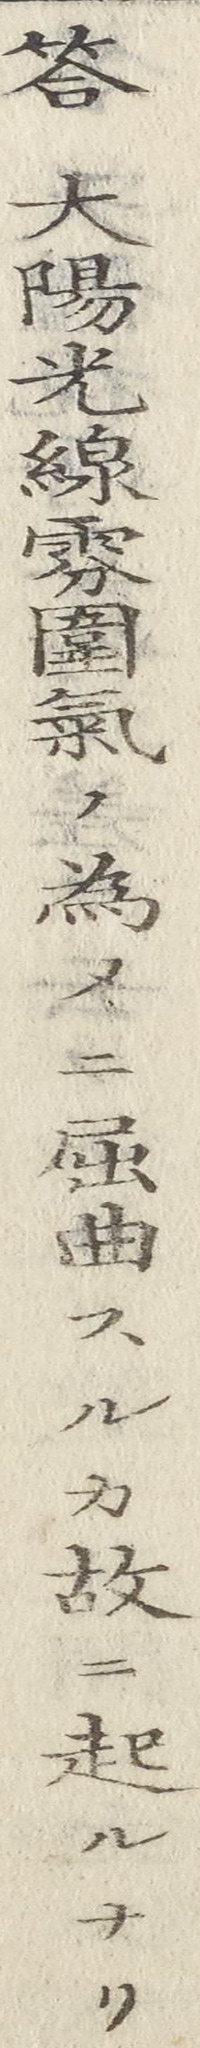答大陽光線雰囲気ノ為メニ屈曲スルカ故ニ起ルナリ
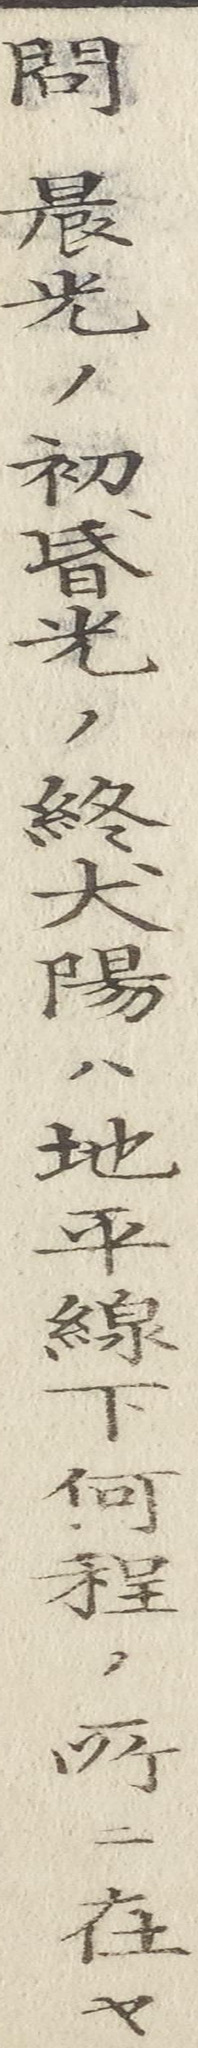問晨光ノ初昏光ノ終、大陽ハ地平線下何程ノ所ニ在ヤ
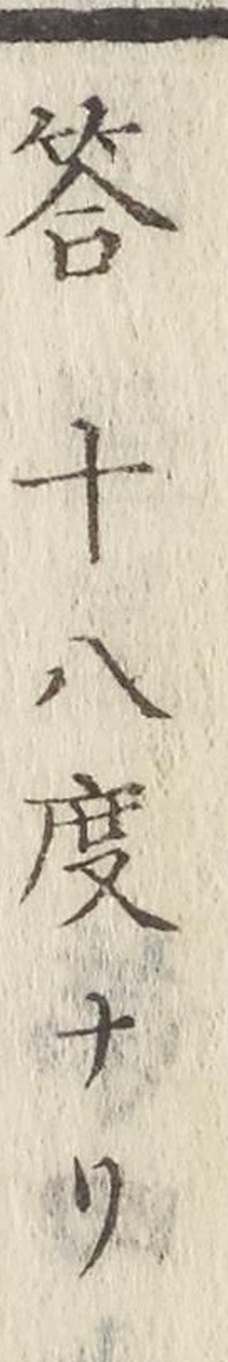答十八度ナリ

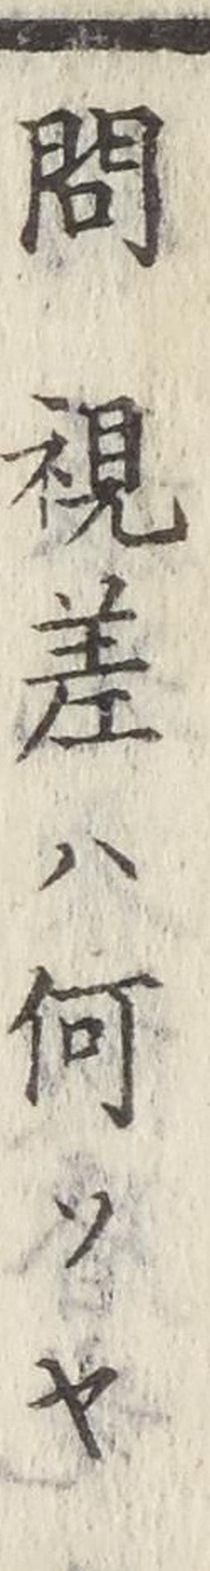問視差ハ何ソヤ
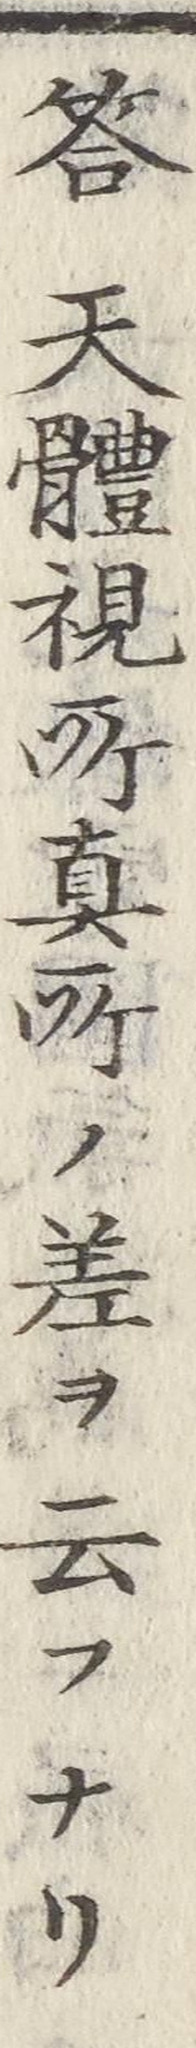答天体視所真所ノ差ヲ云フナリ
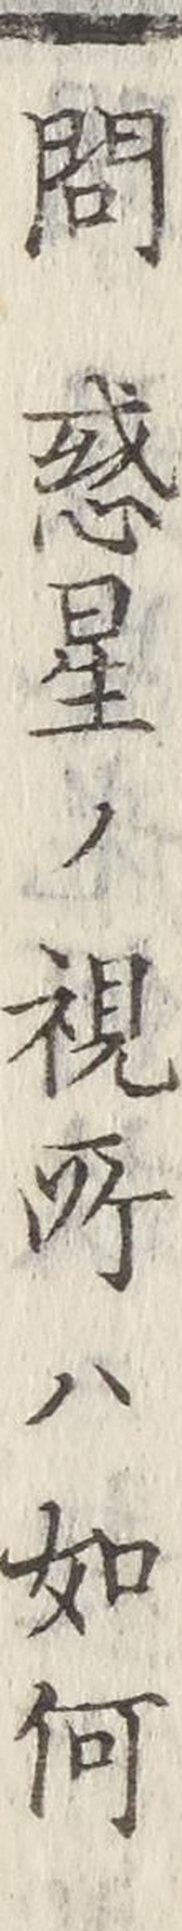問惑星ノ視所ハ如何
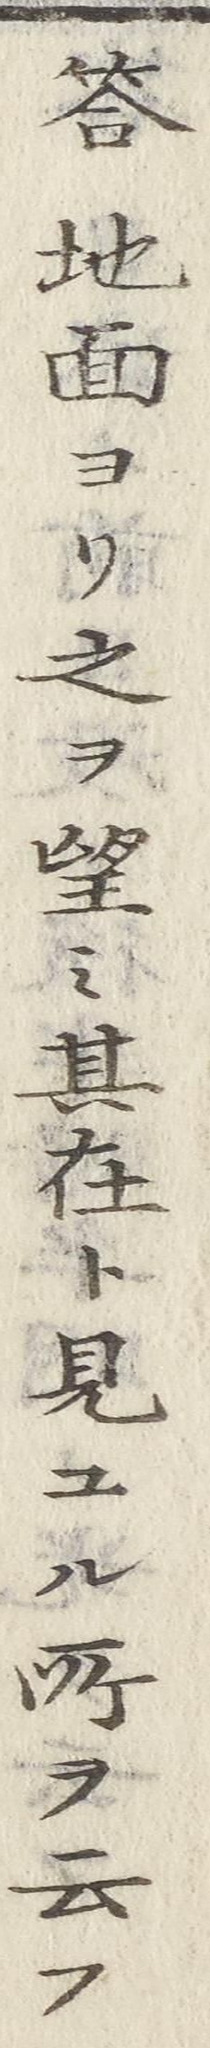答地面ヨリ之ヲ望ミ其在ト見ユル所ヲ云フ
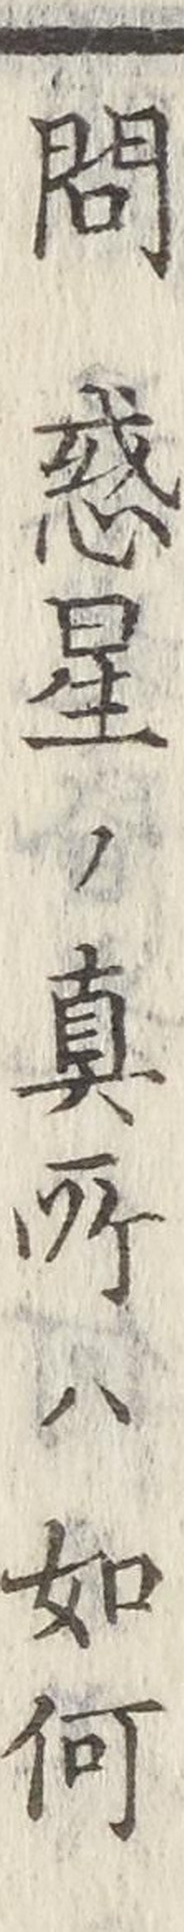問惑星ノ真所ハ如何
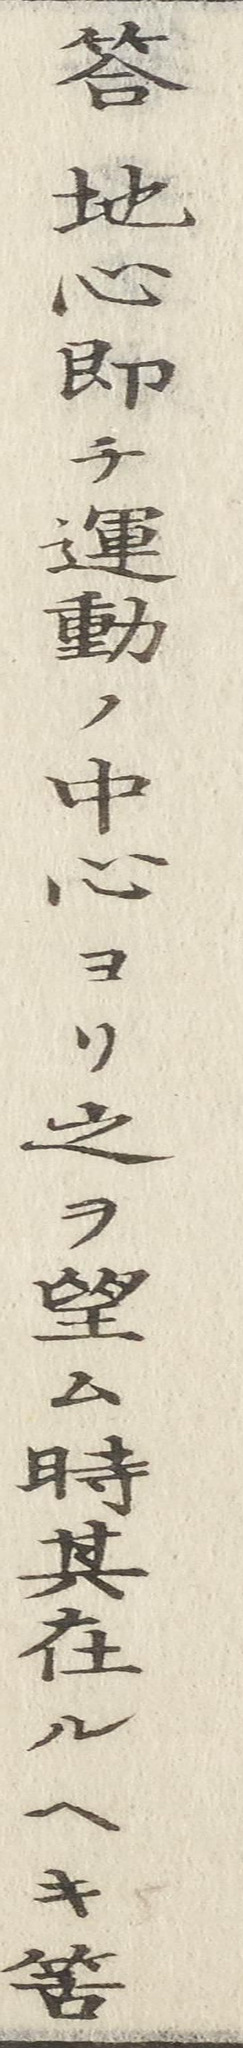答地心即チ運動ノ中心ヨリ之ヲ望ム時其在ルヘキ筈
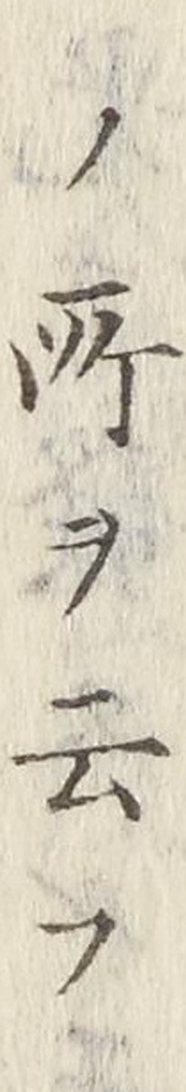ノ所ヲ云フ
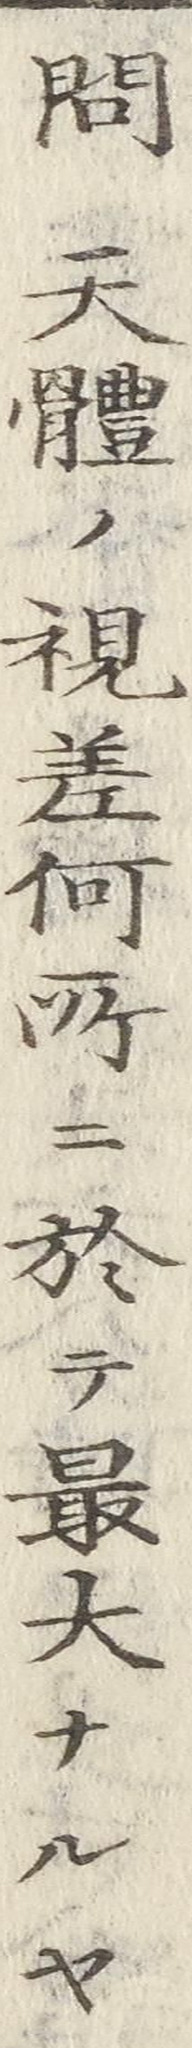問天体ノ視差何所ニ於テ最大ナルヤ
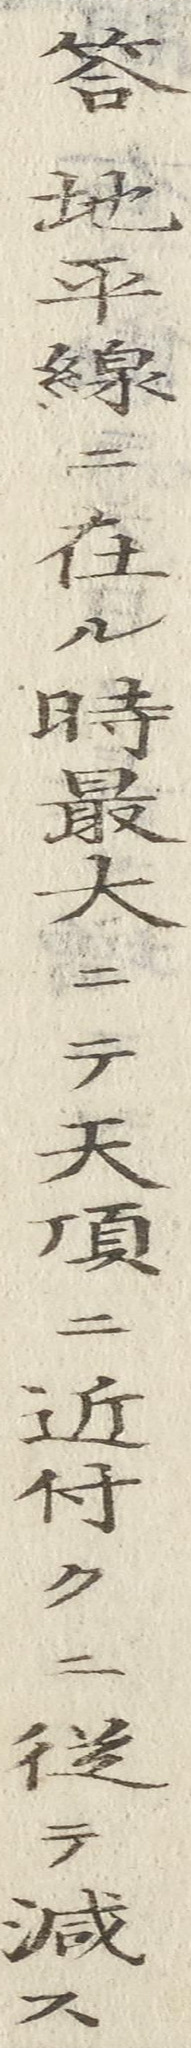答地平線ニ在ル時最大ニテ天頂ニ近付クニ従テ減ス
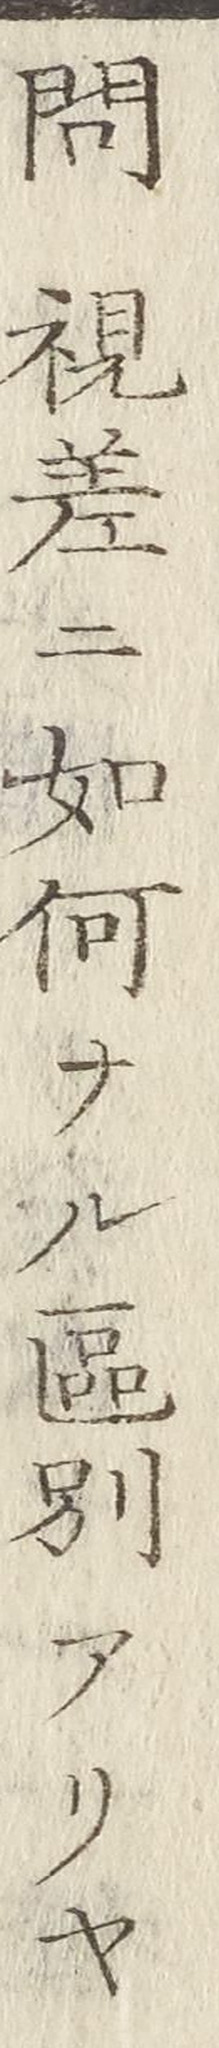問視差如何ナル区別アリヤ
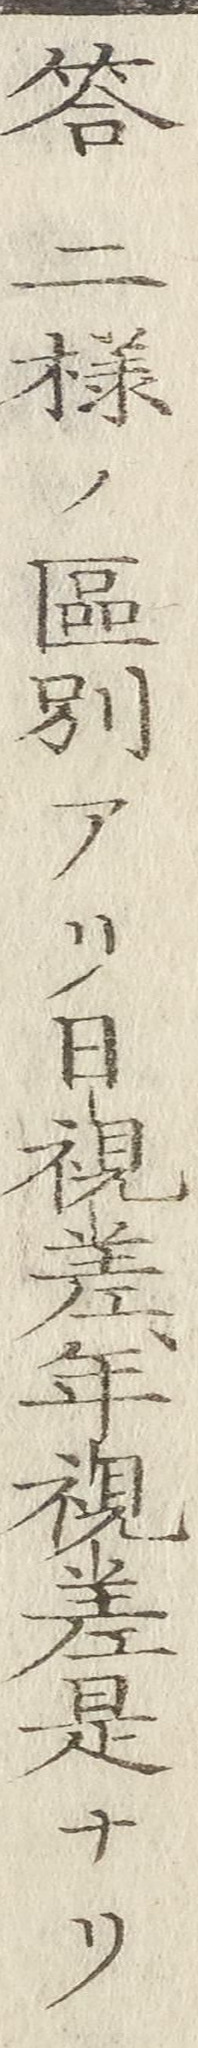答二様ノ区別アリ日-視-差、年-視-差是ナリ
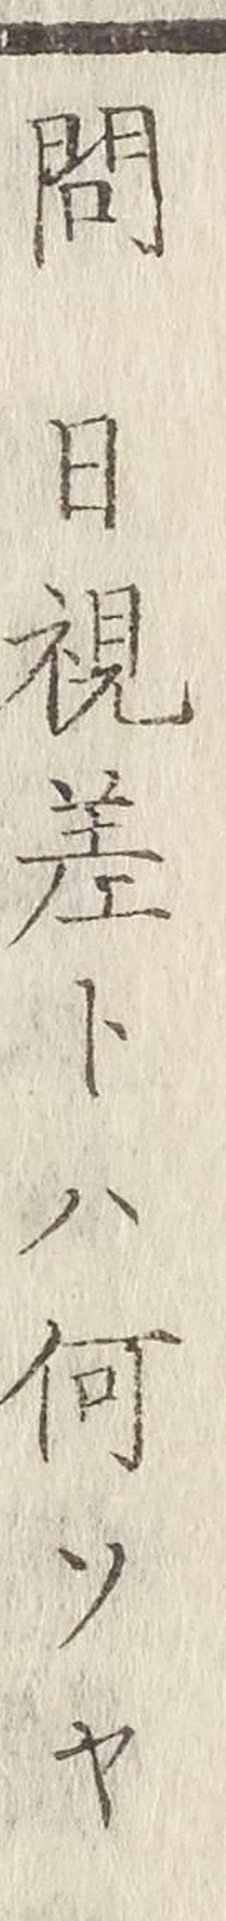問日視差トハ何ソヤ
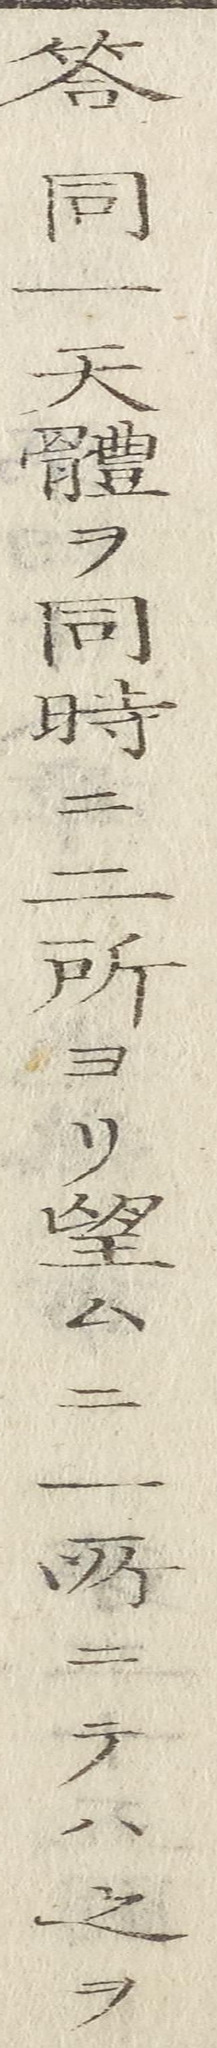答同一天体ヲ同時ニニ所ヨリ望ムニ一所ニテハ之ヲ
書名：星学圖説　下
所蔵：東京大学地震研究所図書室 Earthquake Research Institute Library, The University of Tokyo, JAPAN
